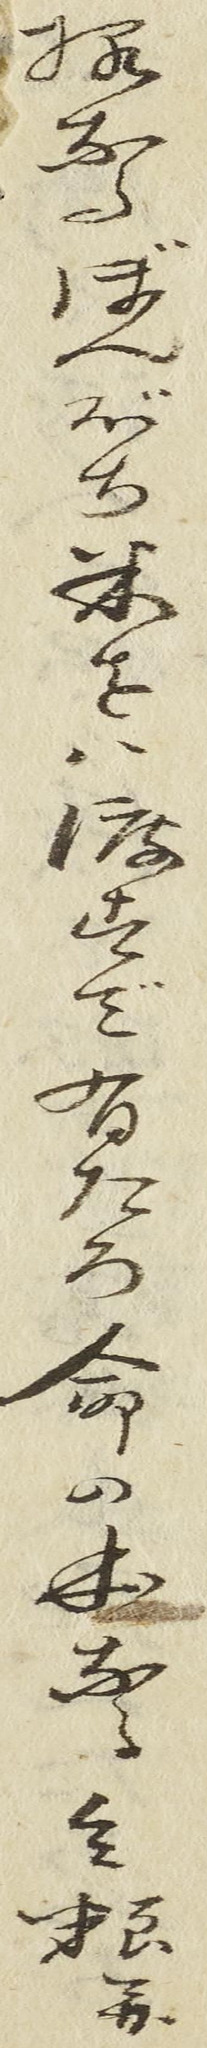様なるぼんぼち米をハ渡すで有たろ命の本なる兵糧并
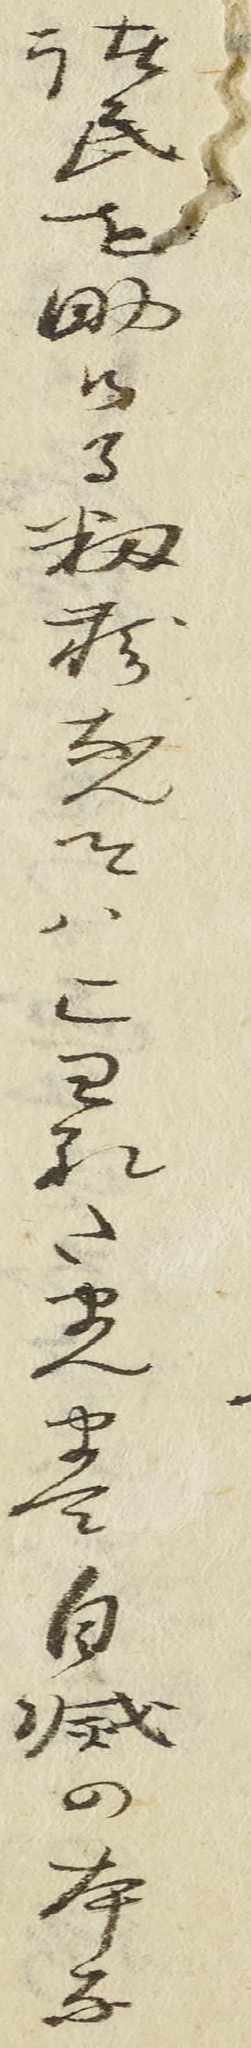諸民を助ける籾蔵なんそハこわれたまんまて自滅の本な
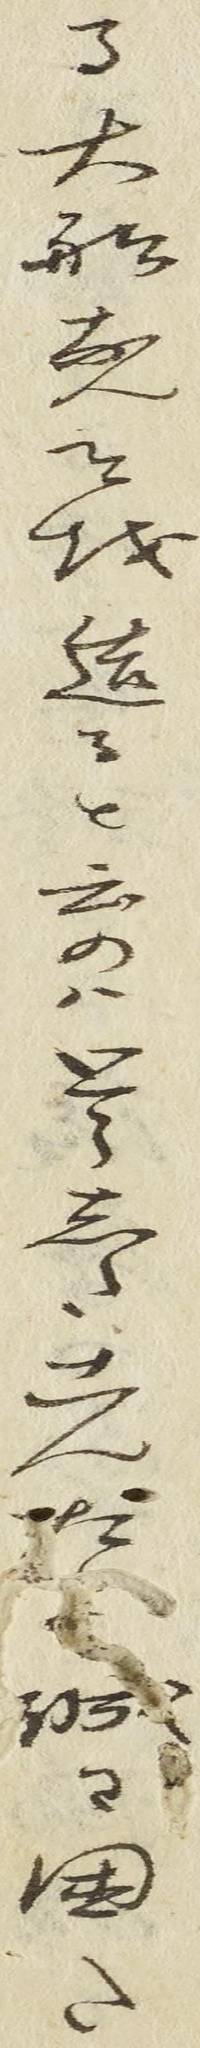る大船なんそを造ると云のハとうしたこんたよ誠に困た
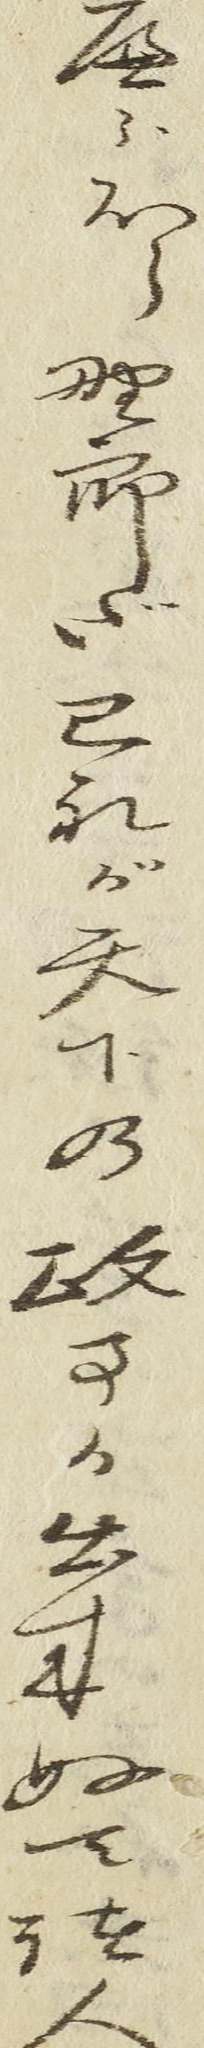へらほら野郎だ己れが天下の政事か出来ぬて諸人
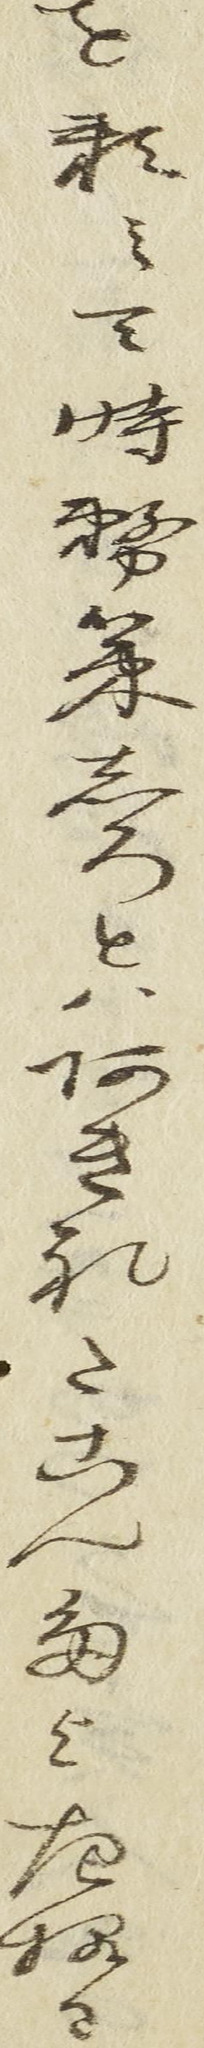を頼ミて時務策しろとハあきれたこんたよ左様に
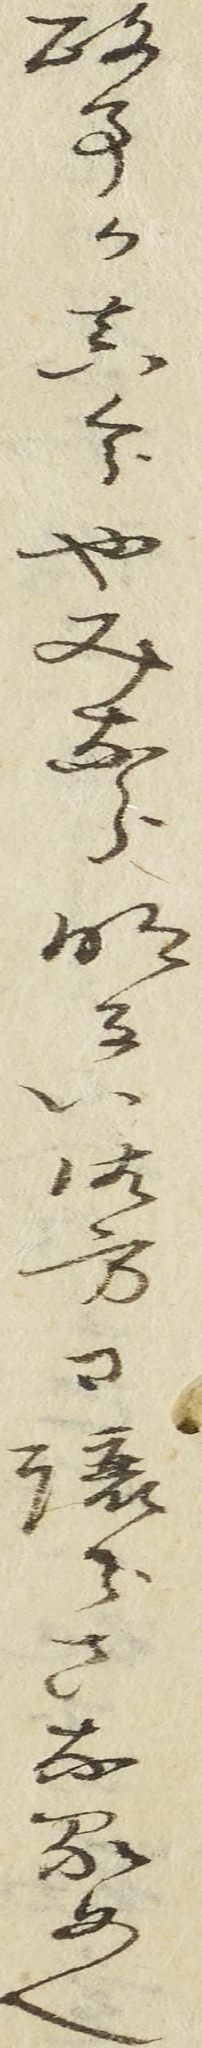政事かまくらやみなら明るい仕方に譲らさなるなん
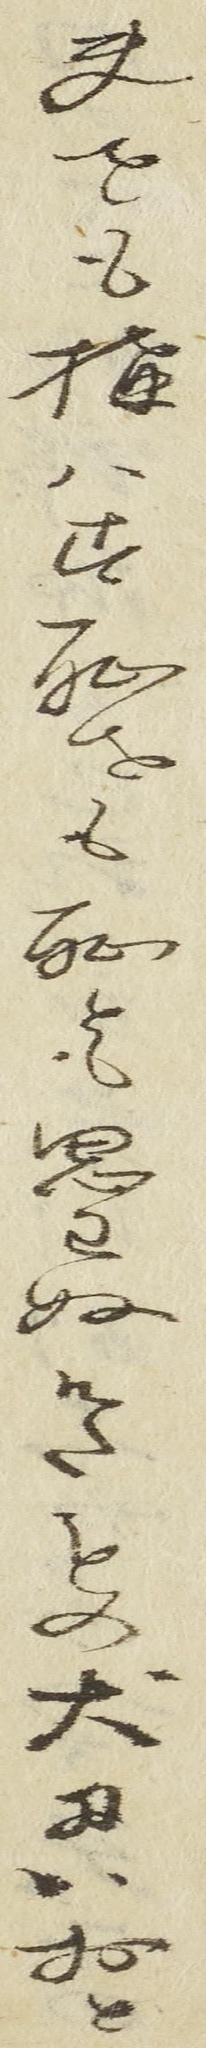夫をも構ハす恥をも恥とも思わぬけたもの犬にハおと
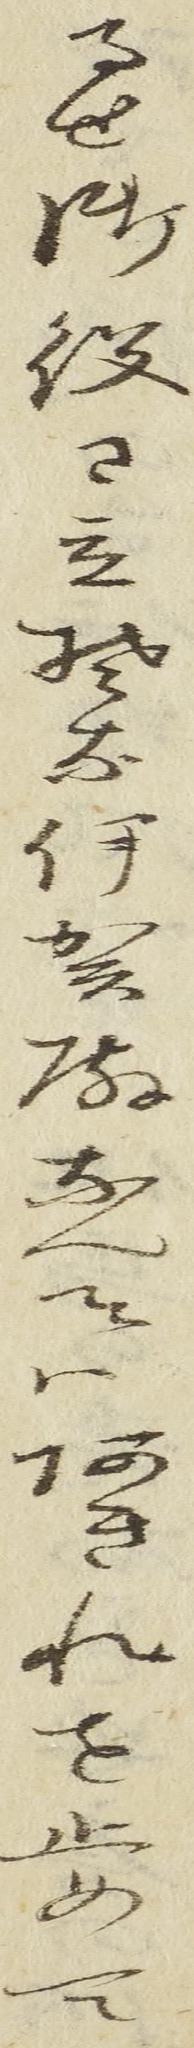るせ御役に立すな伊賀殿なんそハあきれを止めて
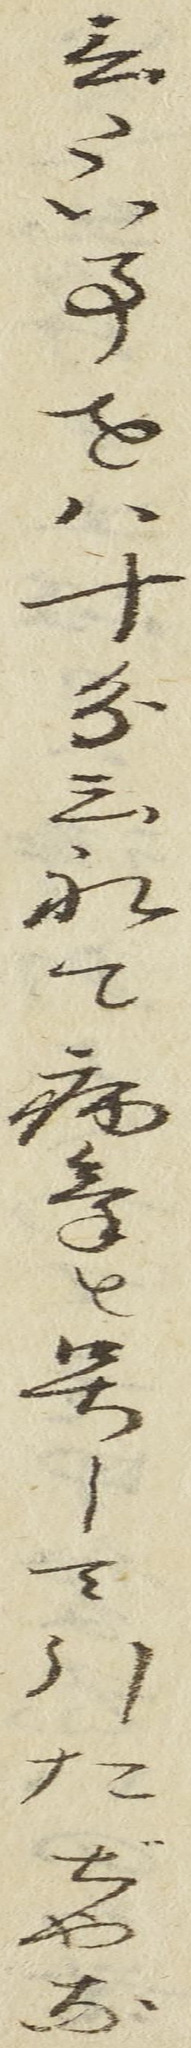云たい事をハ十分云れて病気と号して引たぢやな

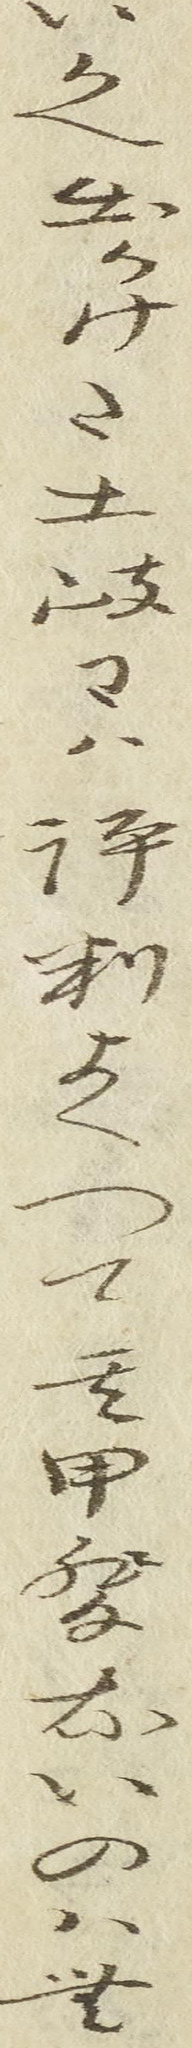いかへ出かけた土岐にハ評判よくつて其甲斐ないのは無
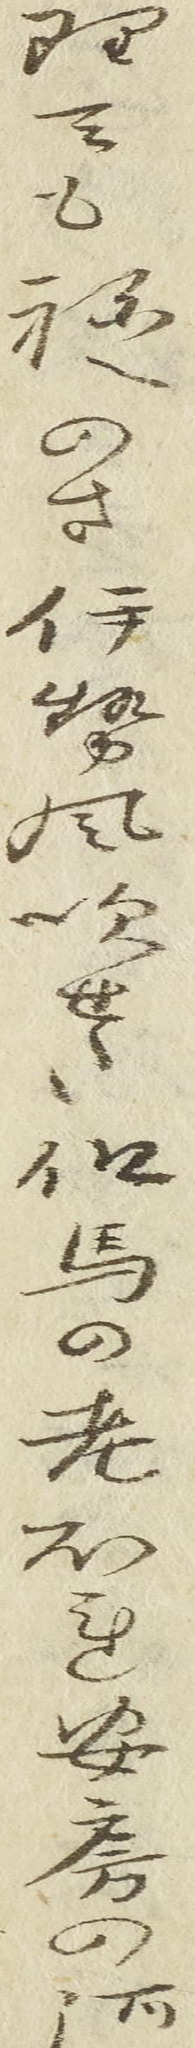理てもねへのさ伊勢風吹せた但馬の老ほれ安房の河
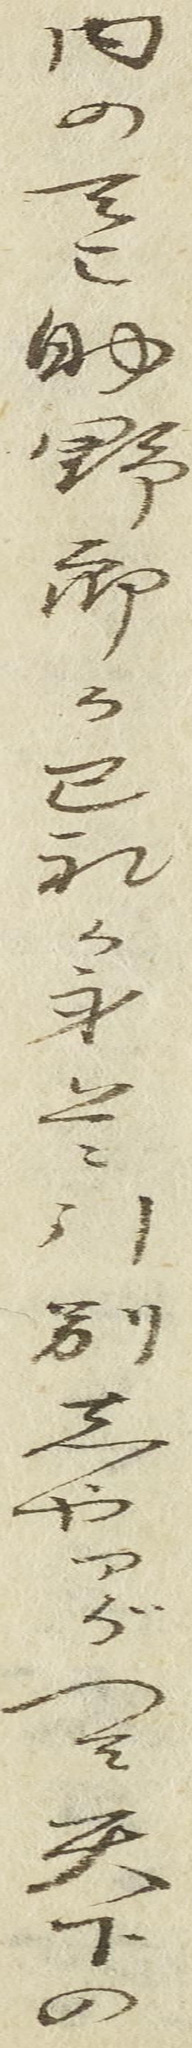内のてに助野郎か己れか身上二引別しやアがつて天下の
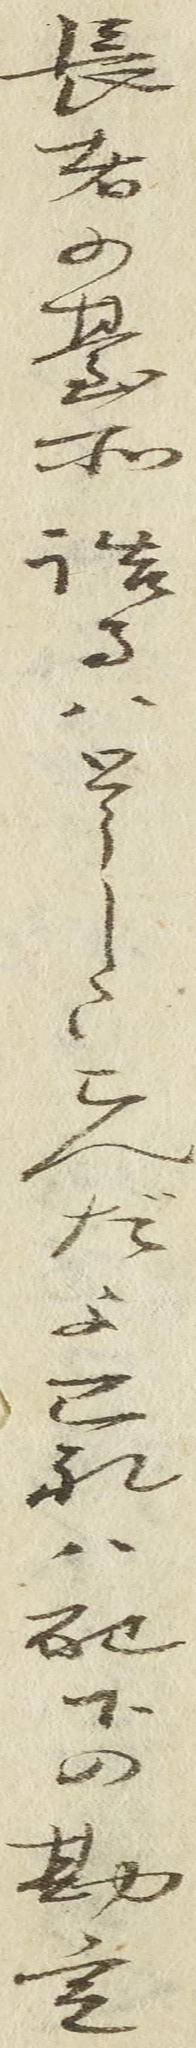長者の台所詰るハとうしたこんだよ己れハ配下の勘定
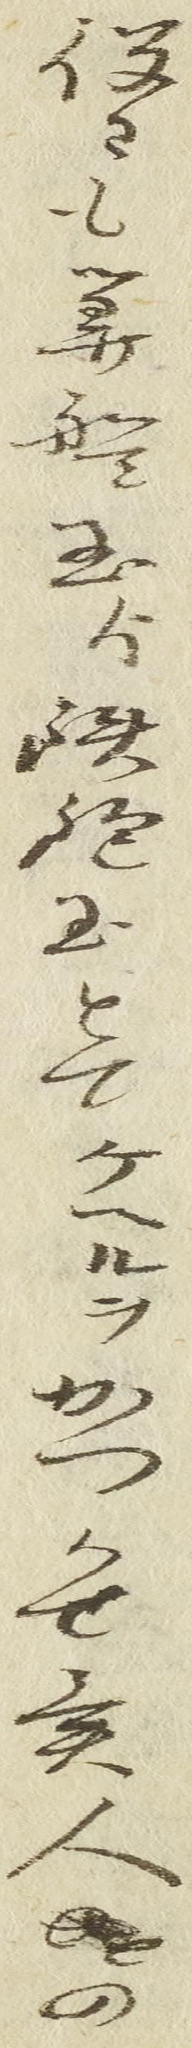役にも算盤玉ゟ鉄炮玉とてケヘルヲかつかせ夷人の
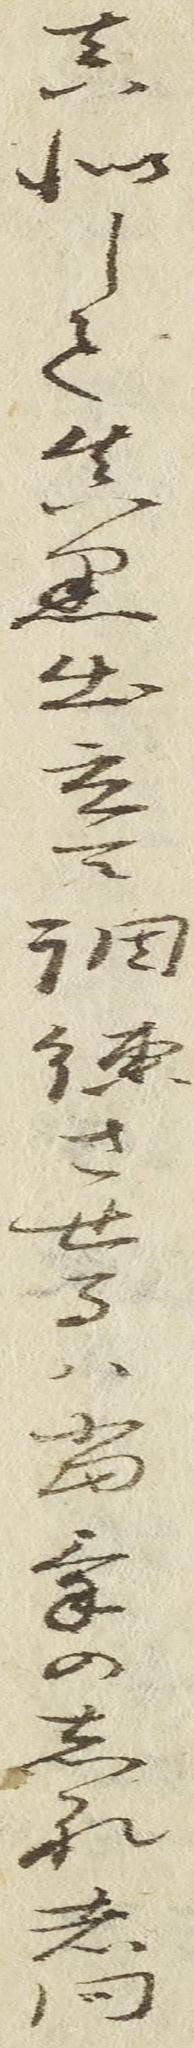まねして真黒出立て調練させるハ当氣のしれ者同
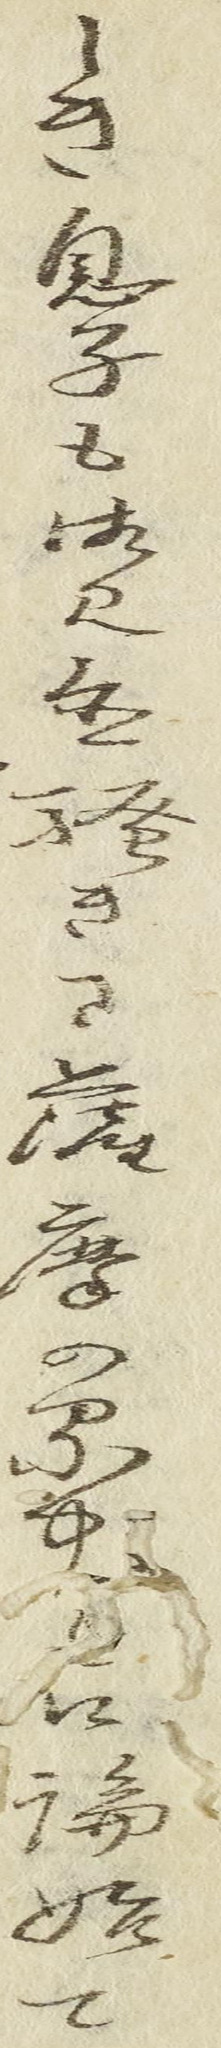しき息子も御見置騒きに薩摩の家中ハ口論始て
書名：世説ヤンレフシ写、駿州田中城地震ニ付内外破損御届書、豫州大洲城地震ニ付内外破損御届書・封廻状
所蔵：東京大学地震研究所図書室 Earthquake Research Institute Library, The University of Tokyo, JAPAN
